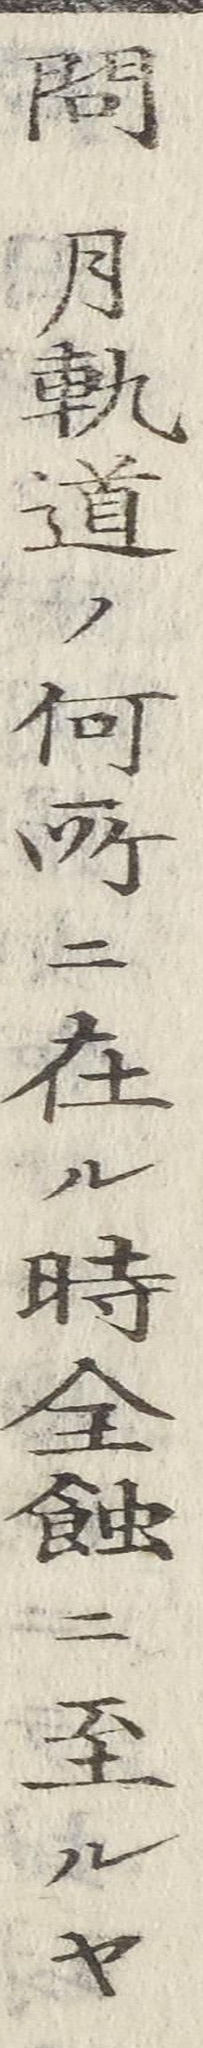問月軌道ノ何所ニ在ル時全蝕ニ至ルヤ
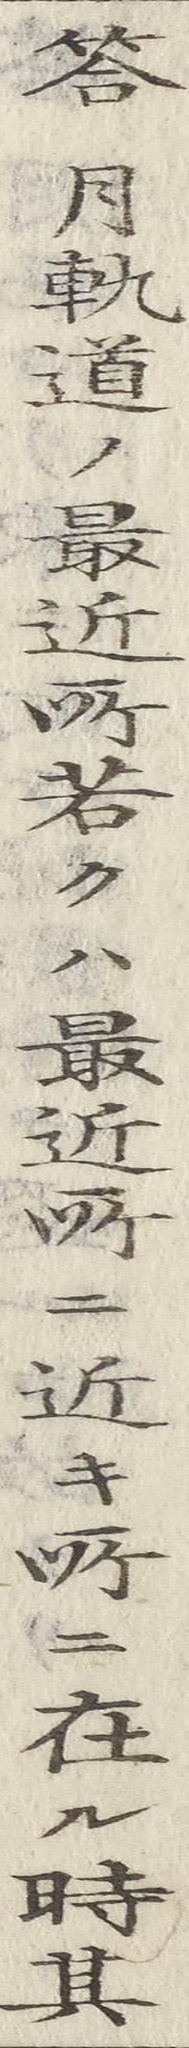答月軌道ノ最近所若クハ最近所ニ近キ所ニ在ル時其
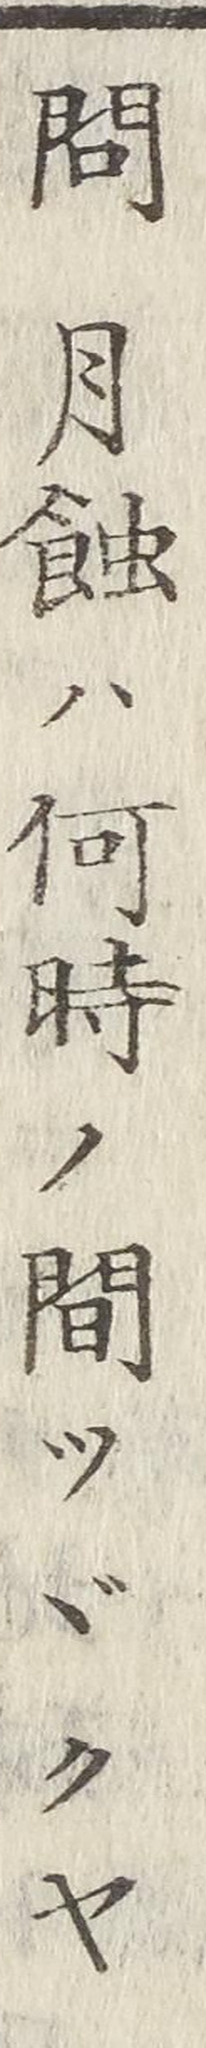問月蝕ハ何時ノ間ツヾクヤ
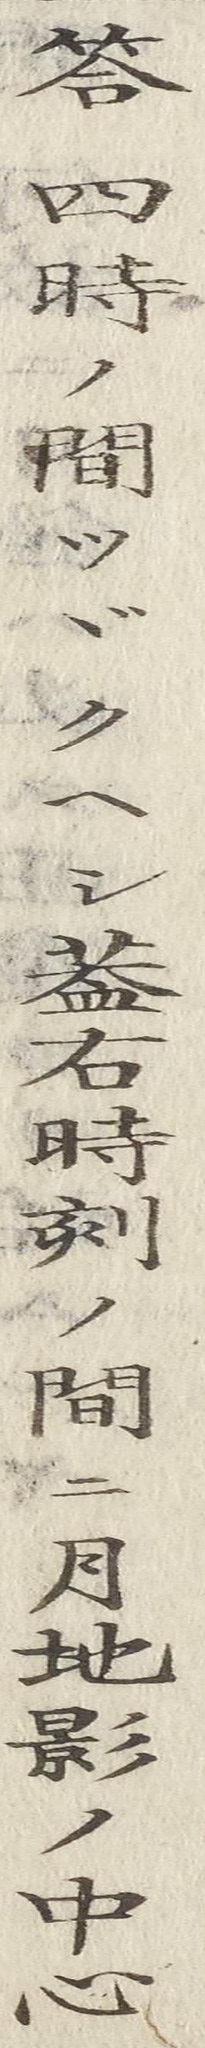答四時ノ間ツヾクヘシ蓋右時刻ノ間ニ月地影ノ中心
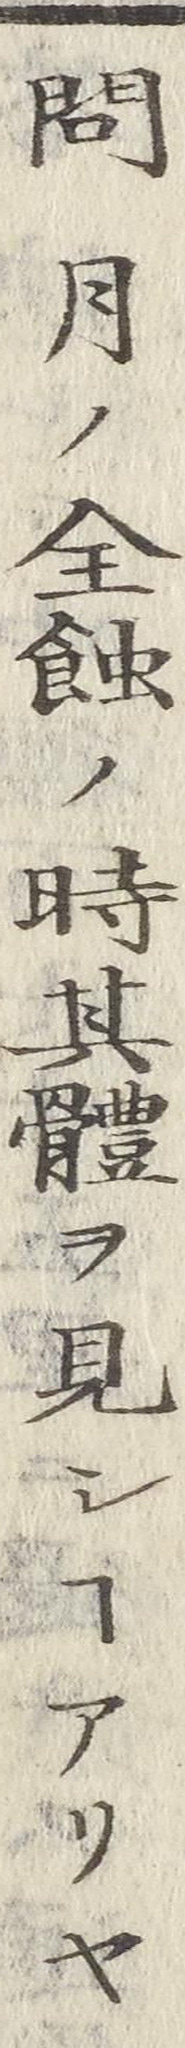問月ノ全蝕ノ時其体ヲ見シコトアリヤ
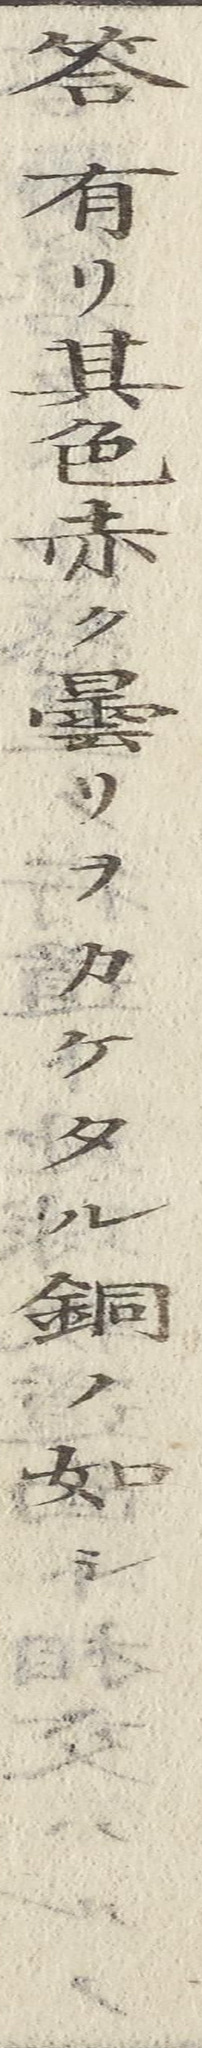答有リ其色赤ク曇リヲカケタル銅ノ如シ
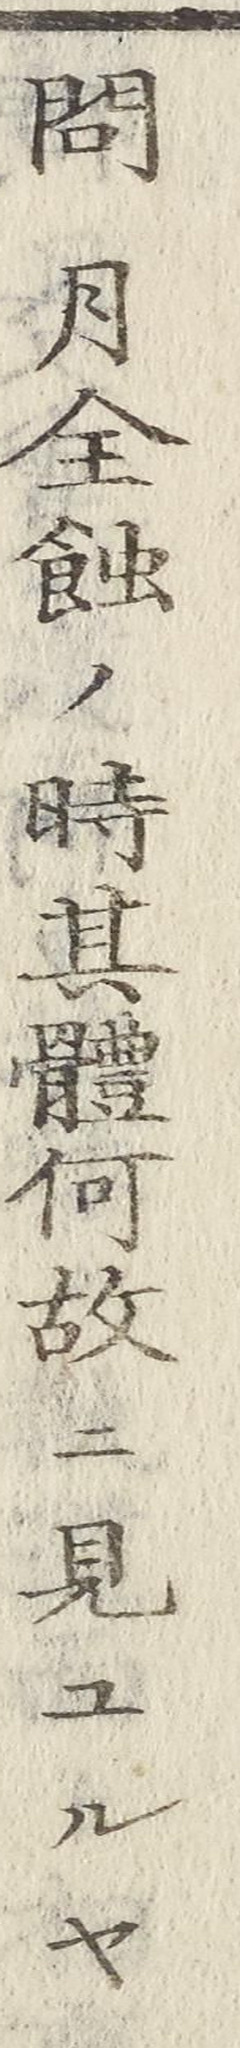問月全蝕ノ時其体何故ニ見ユルヤ
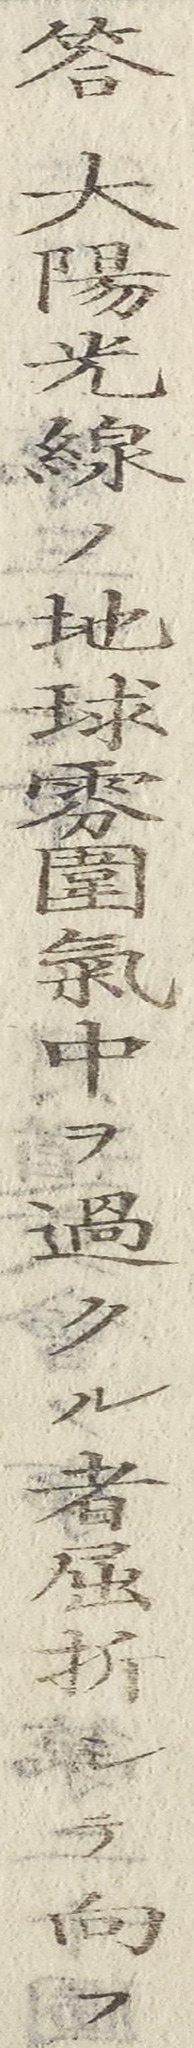答大陽光線ノ地球雰囲気中ヲ過クル者屈折シテ向フ
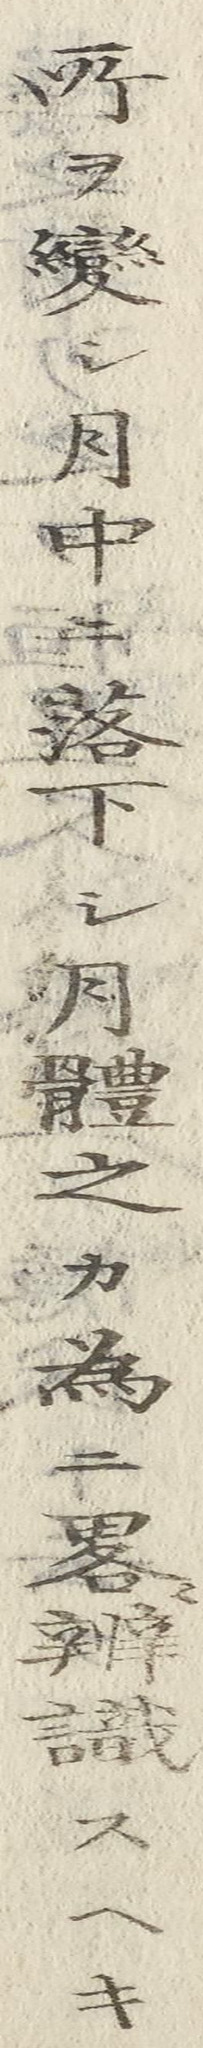所ヲ変シ月中ニ落下シ月体之カ為ニ略弁識スヘキ
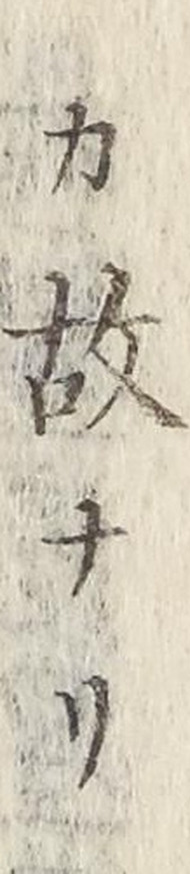カ故ナリ
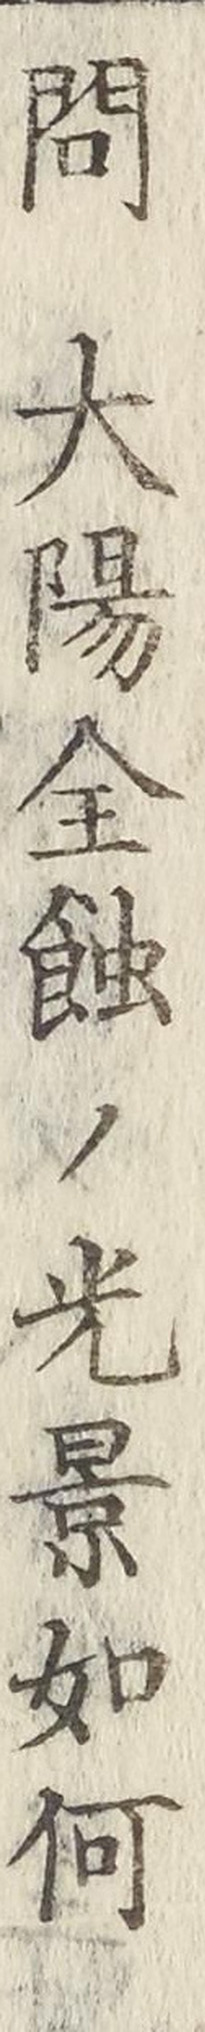問大陽全蝕ノ光景如何
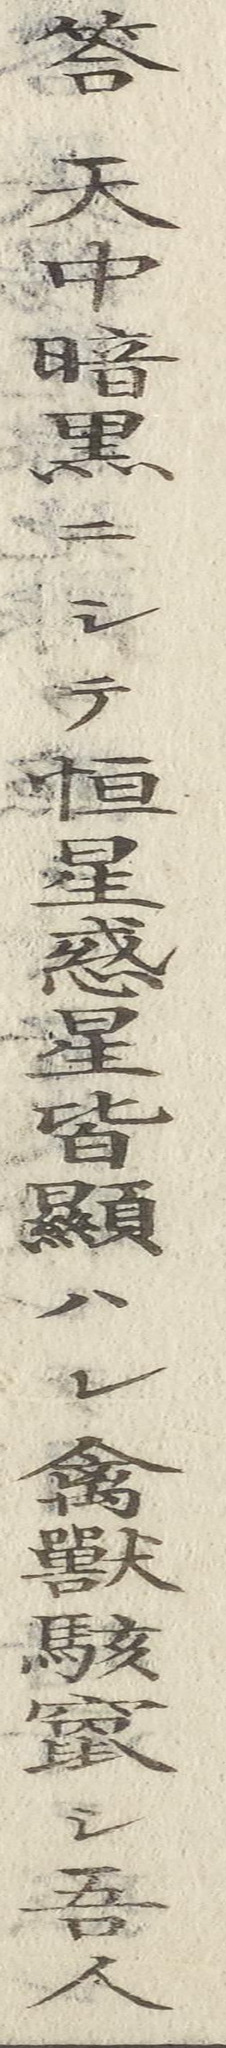答天中暗黒ニシテ恒星惑星皆顕ハレ禽獣駭竄シ吾人
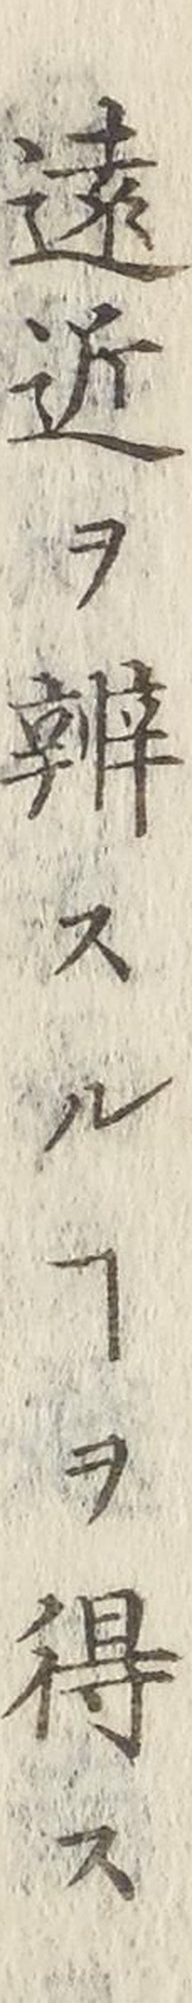遠近ヲ弁スルコトヲ得ス
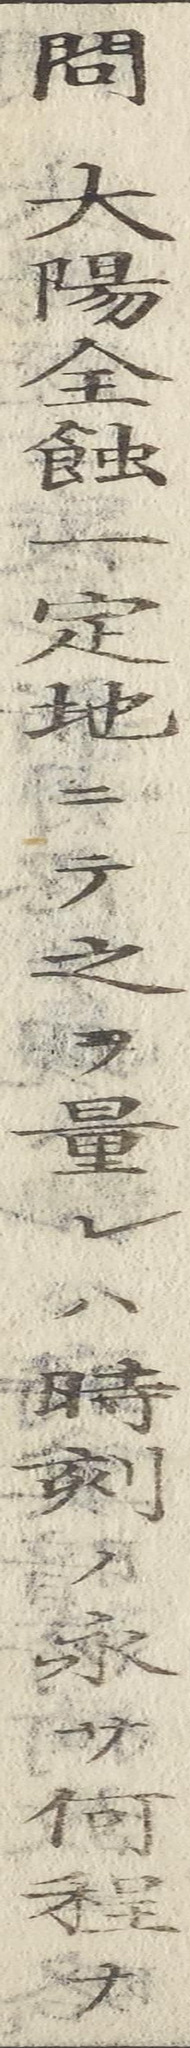問大陽全蝕一定地ニテ之ヲ量レハ時刻ノ永サ何程ナ

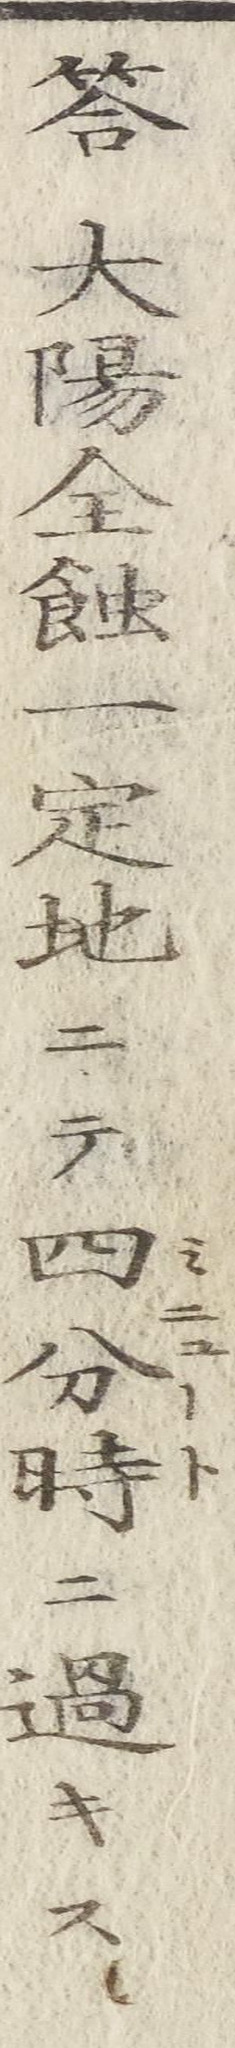答大陽全蝕一定地ニテ四分時ニ過キス
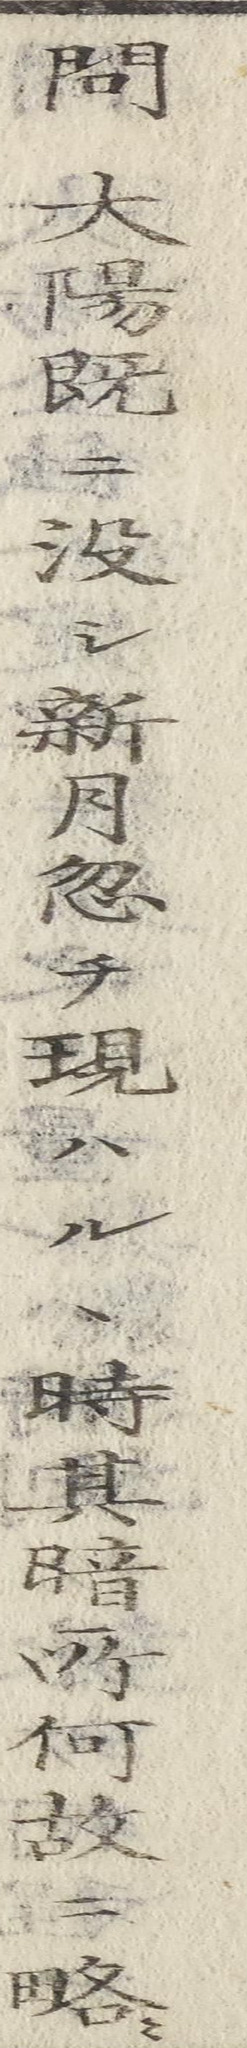問大陽既ニ没シ新月忽チ現ハルヽ時其暗所何故ニ略々
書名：星学圖説　下
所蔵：東京大学地震研究所図書室 Earthquake Research Institute Library, The University of Tokyo, JAPAN
